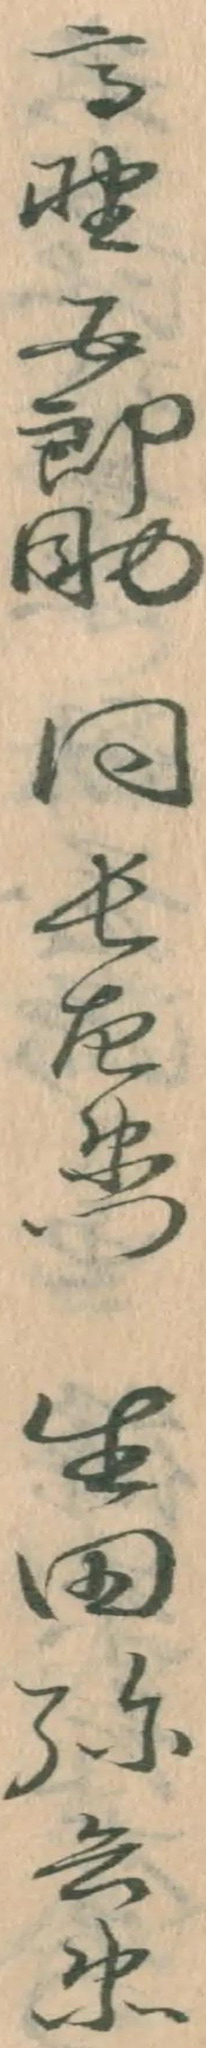高野五郎助同長左衛門生田弥兵衛

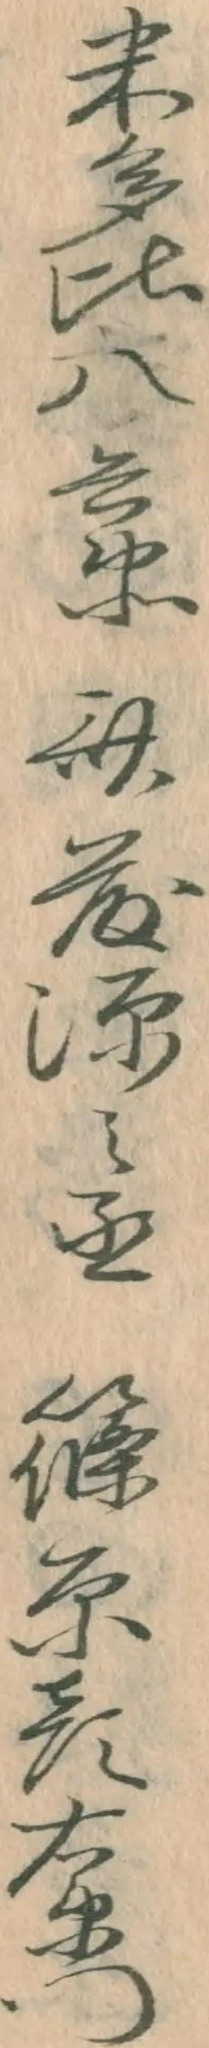米多比八兵衛斎藤源之丞篠原彦右衛門
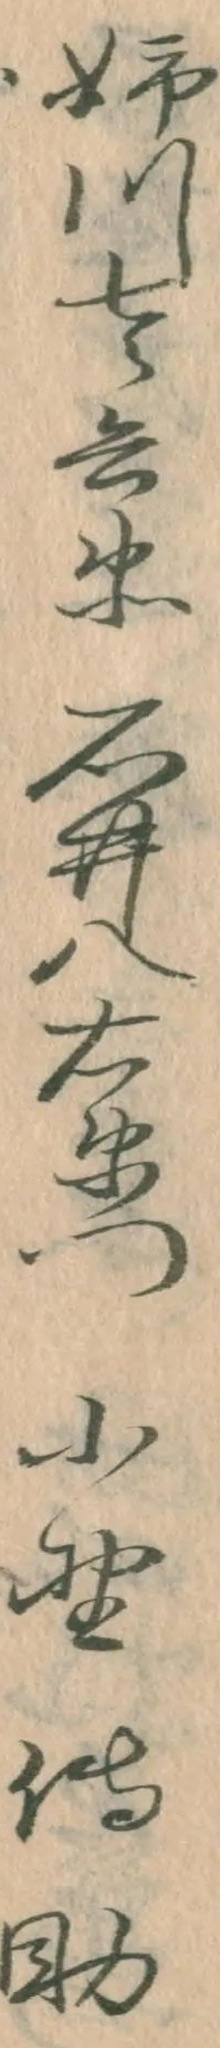姉川七郎兵衛石井八右衛門小野伝助
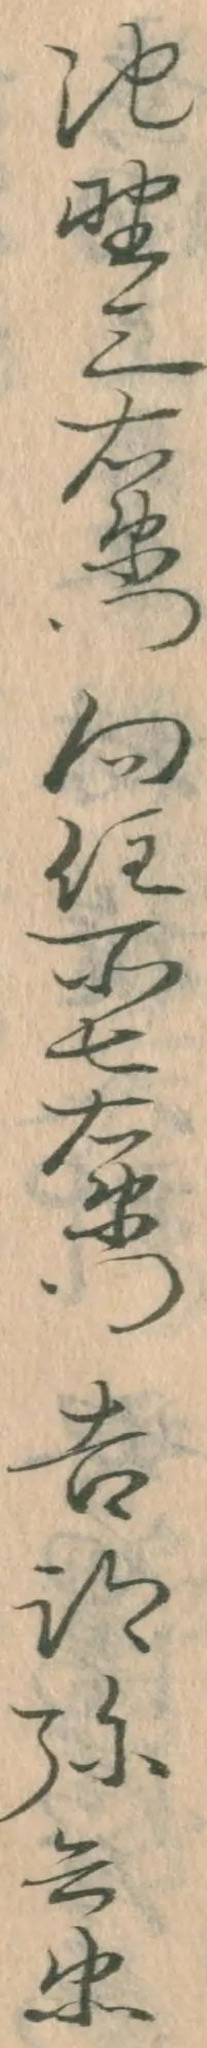池野三右衛門向住所七右衛門吉跡弥兵衛
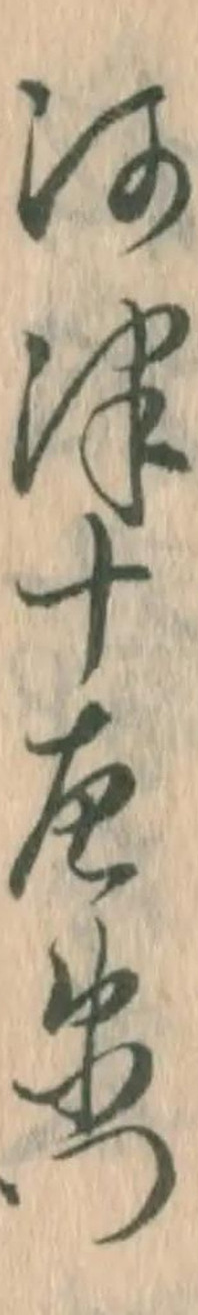河津十左衛門
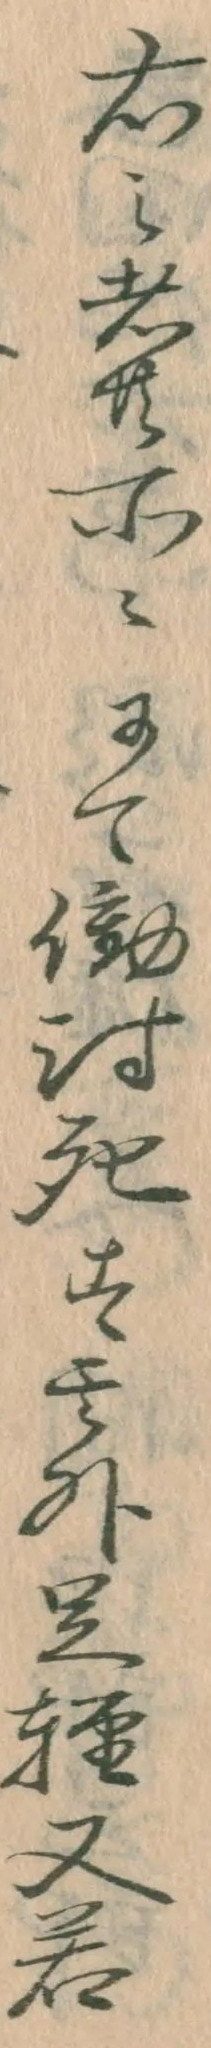右之者共所々尓て働討死春其外足軽又若
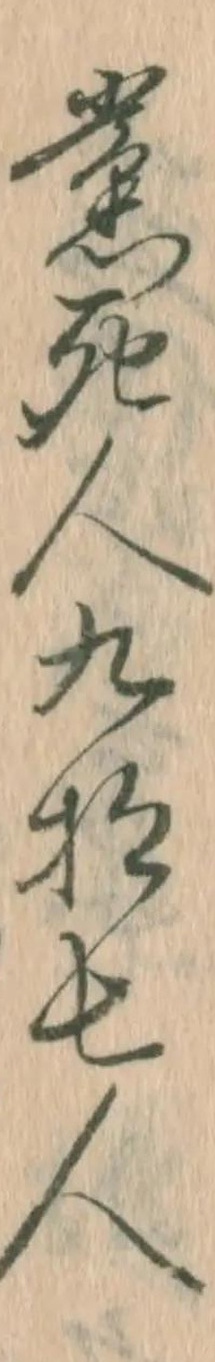藤死人九拾七人
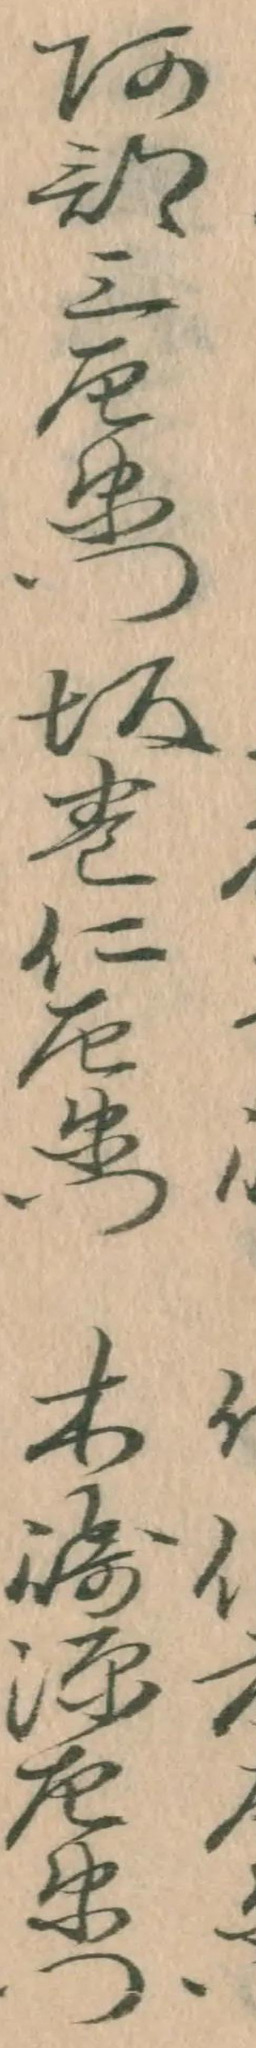阿部左衛門坂巻仁左衛門木崎源左衛門
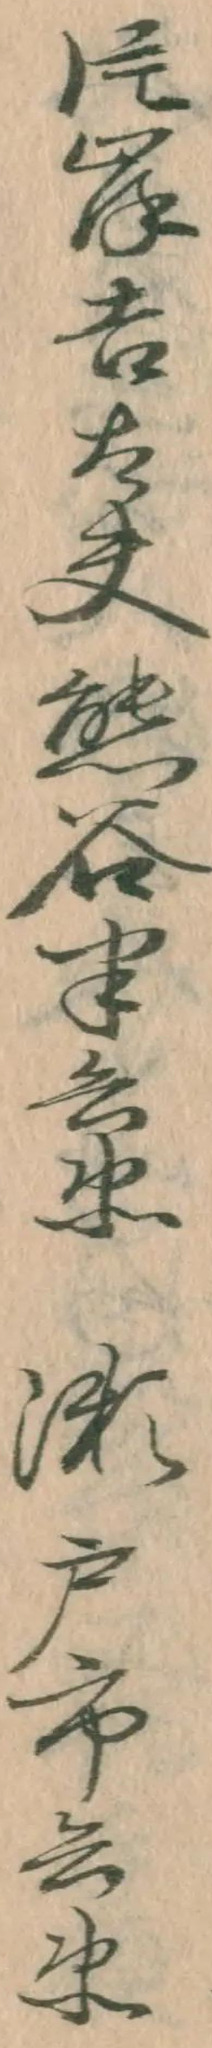片岸吉太夫熊谷半兵衛瀬戸市兵衛
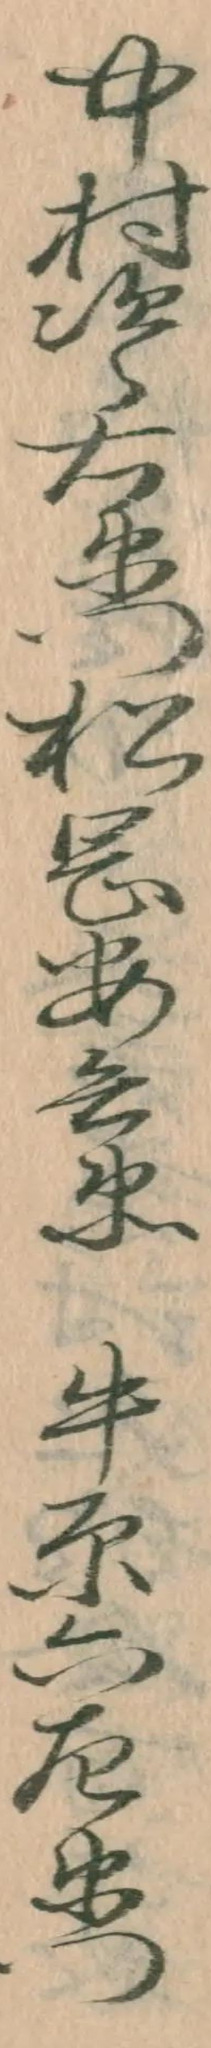中村次郎右衛門松岡安兵衛牛原六左衛門
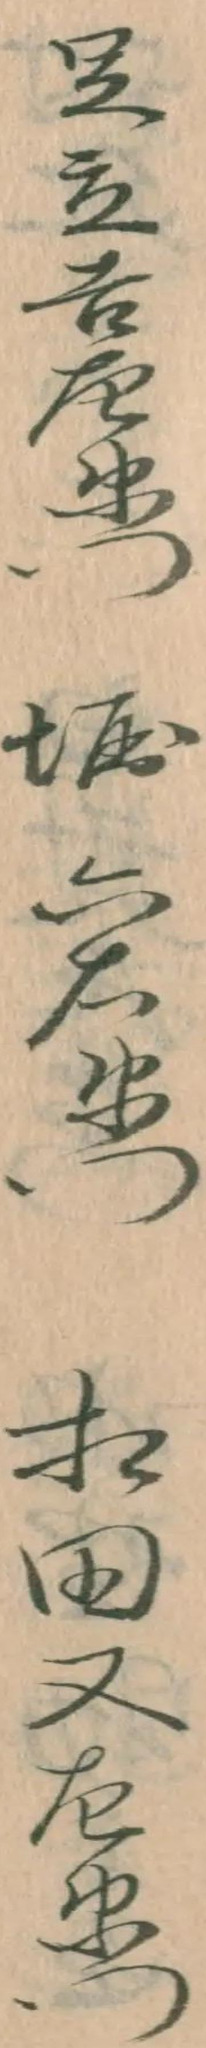足立吉左衛門堀六右衛門相田又左衛門
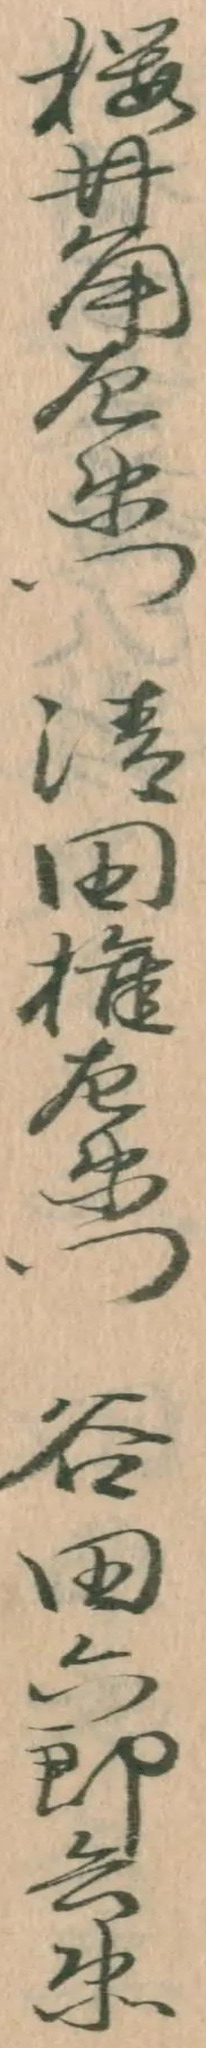桜井角左衛門清田権左衛門谷田六郎兵衛
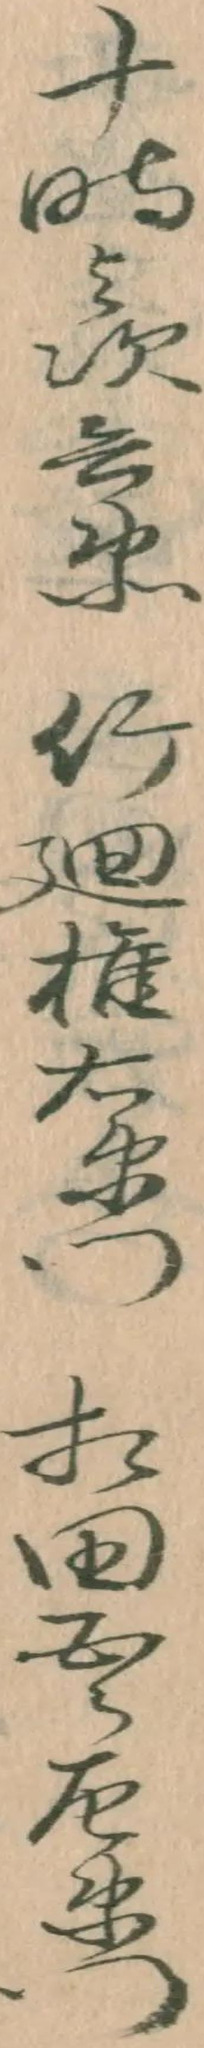十時与次兵衛竹廻権右衛門相田五郎左衛門
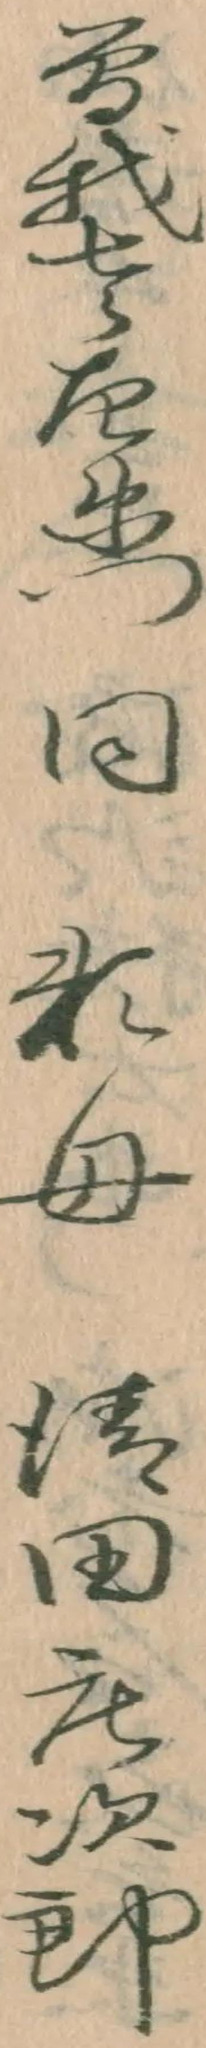曽我七郎左衛門同頼母清田庄次郎
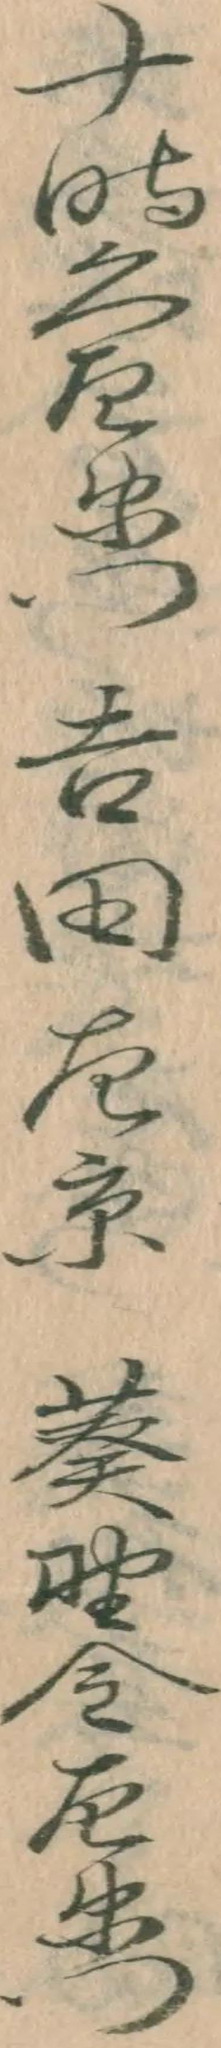十時久左衛門吉田左京菱野金左衛門
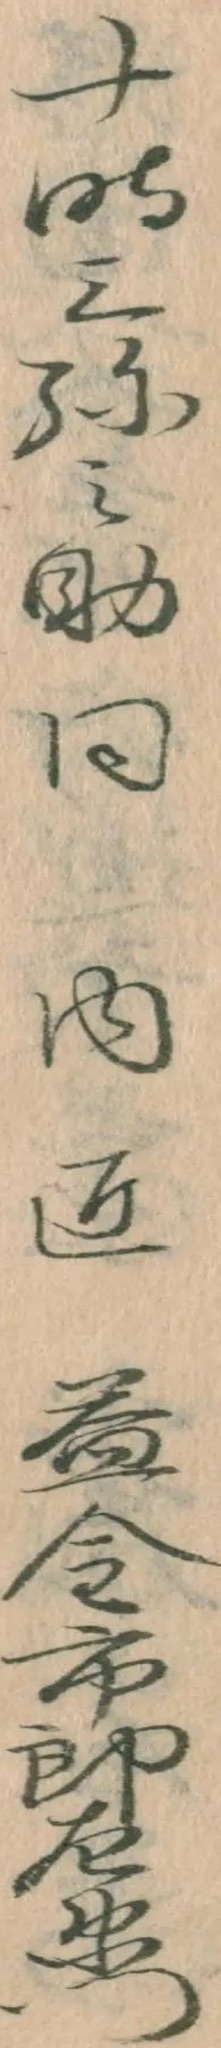十時三弥之助同内匠益金市郎左衛門
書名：切支丹御退治記 49巻. [9]
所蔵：国立国会図書館 National Diet Library, JAPAN
